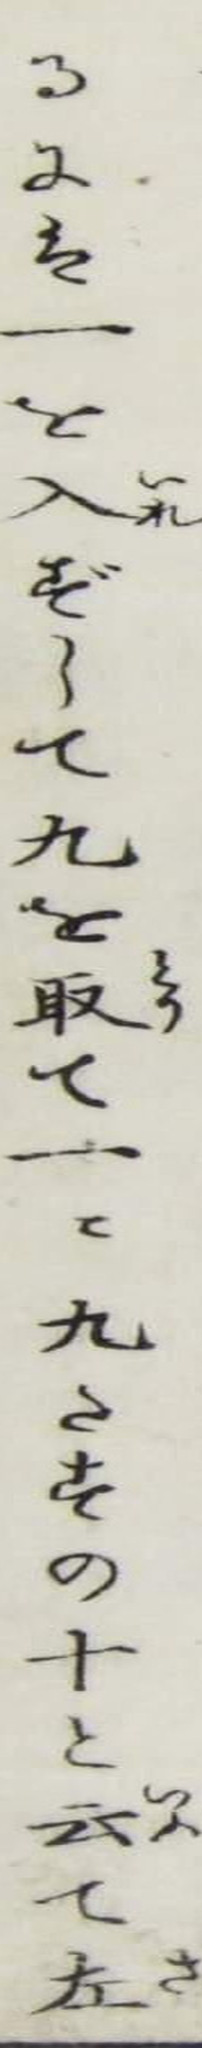るには一を入ずして九を取て一ニ九たすの十と云て左

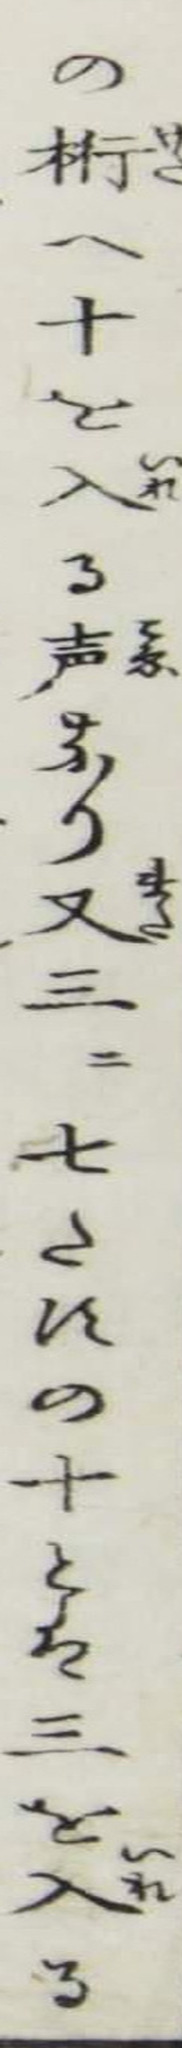の桁へ十を入る声なり又三ニ七たすの十とは三を入る
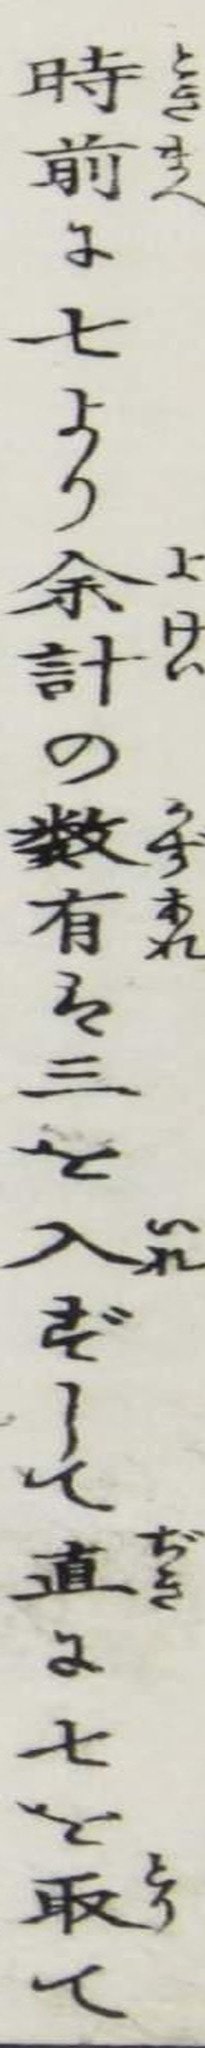時前に七より余計の数有は三を入ずして直に七を取て
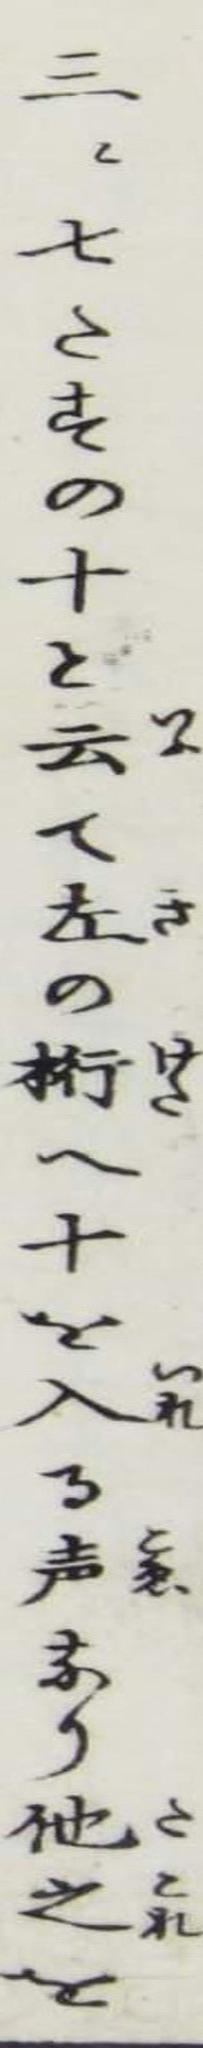三ニ七たすの十と云て左の桁へ十を入る声なり他之を
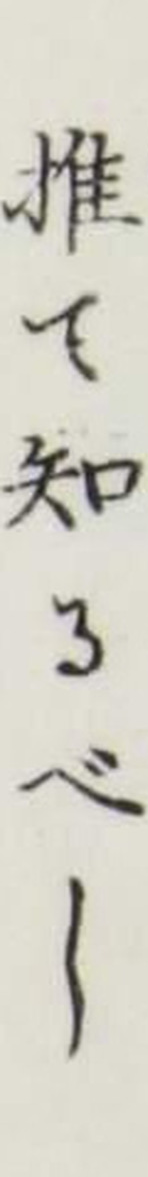推て知るべし
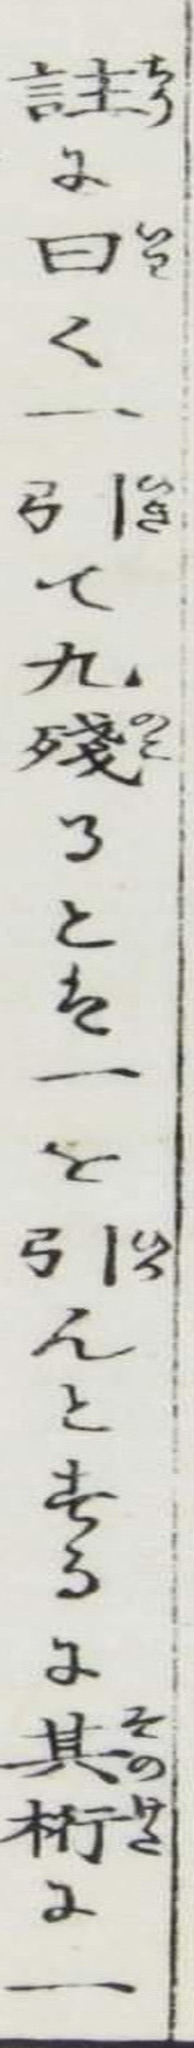註に曰く一引て九残るとは一を引んとするに其桁に一
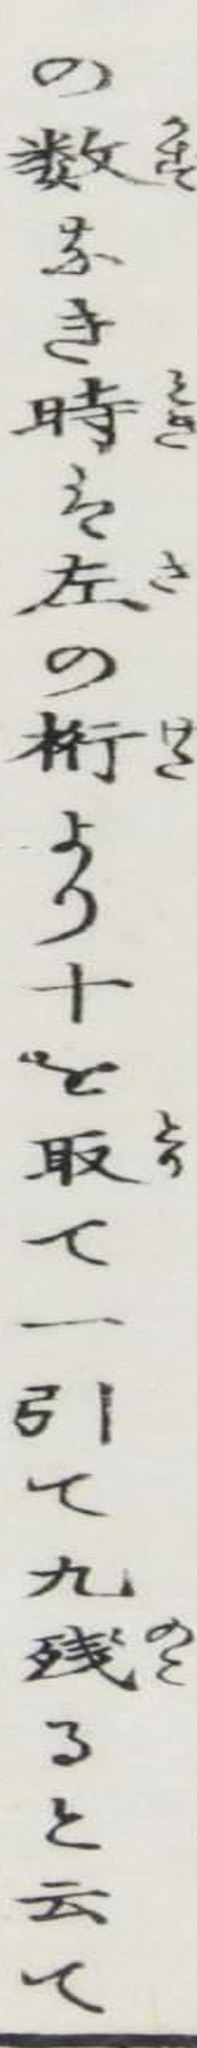の数なき時は左の桁より十を取て一引て九残ると云て
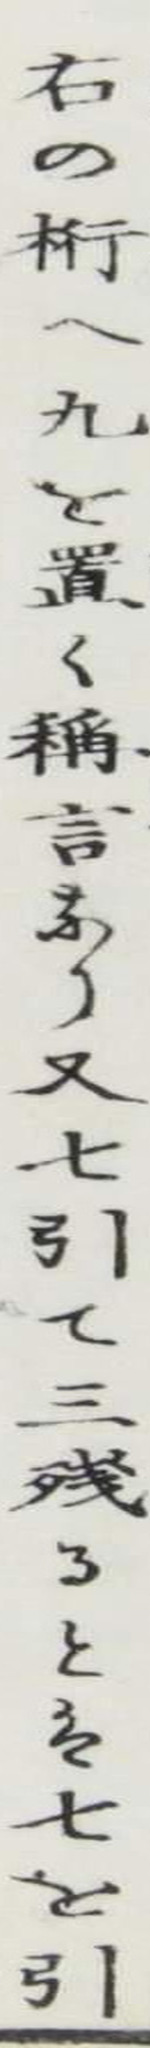右の桁へ九を置く称言なり又七引て三残るとは七を引
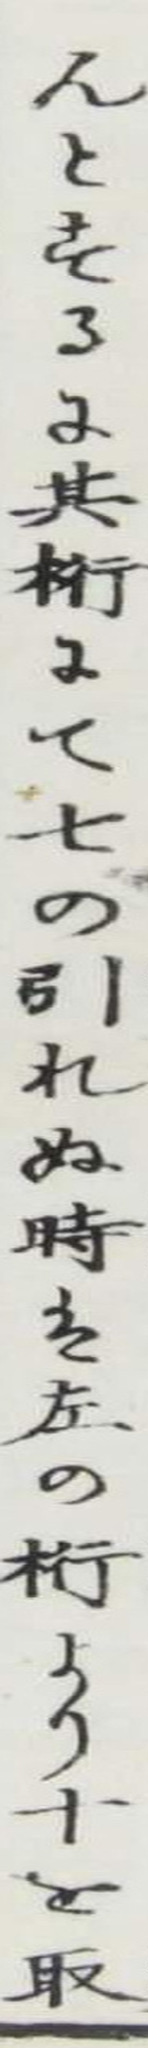んとするに其桁にて七の引れぬ時は左の桁より十を取
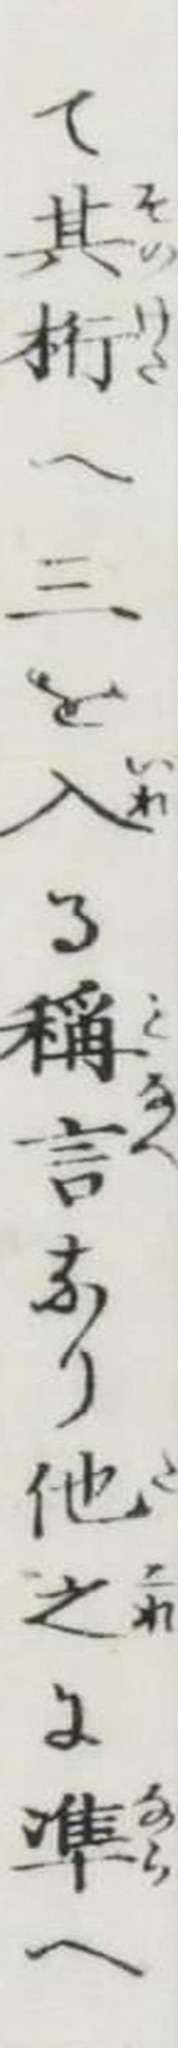て其桁へ三を入る称言なり他之に準へ
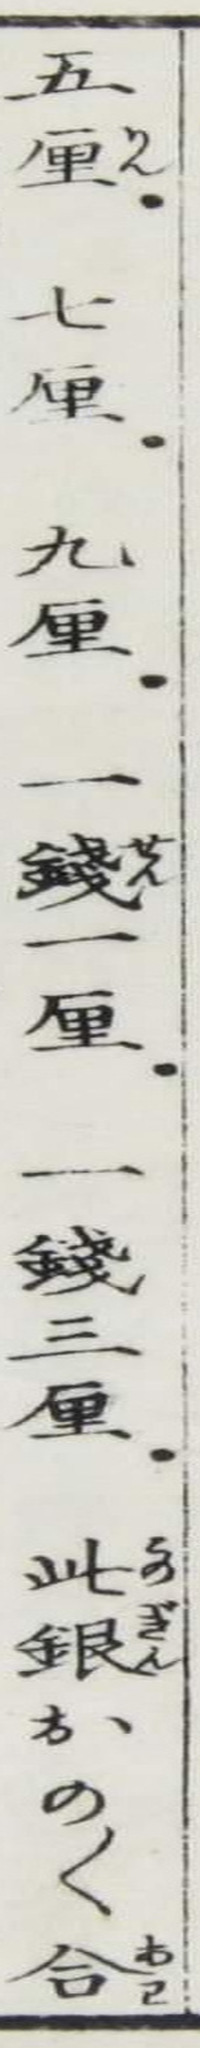五厘．七厘．九厘．一銭一厘．一銭三厘．此銀おの〳〵合
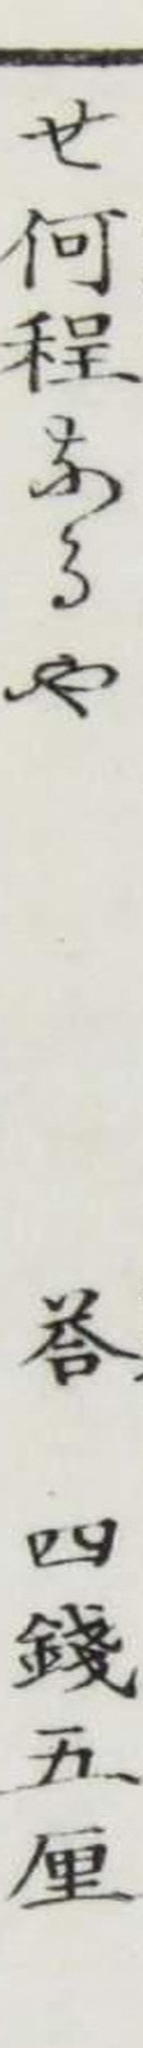せ何程なるや答四銭五厘
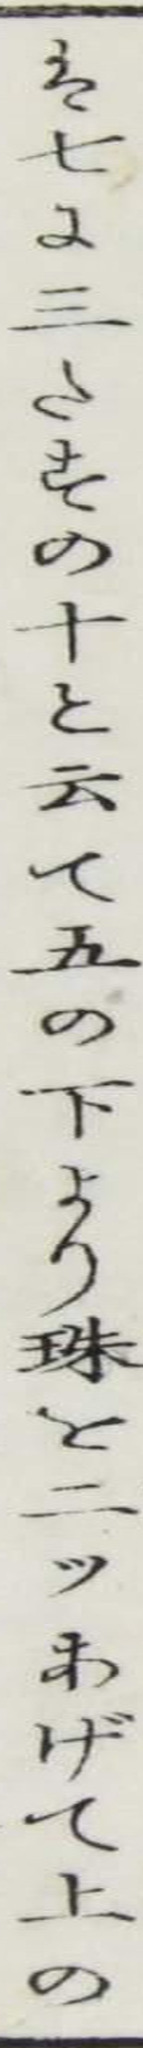は七に三たすの十と云て五の下より珠を二ッあげて上の
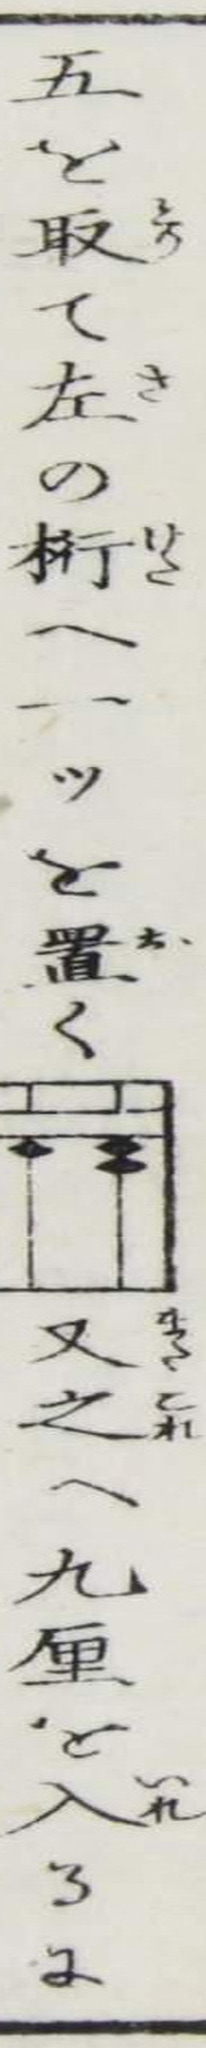五を取て左の桁へ一ッを置く又之へ九厘を入るに
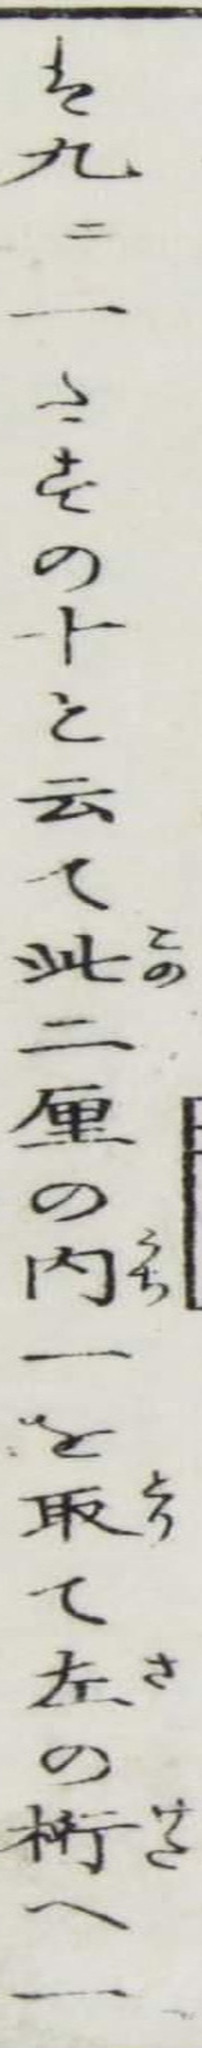は九ニ一たすの十と云て此二厘の内一を取て左の桁へ一
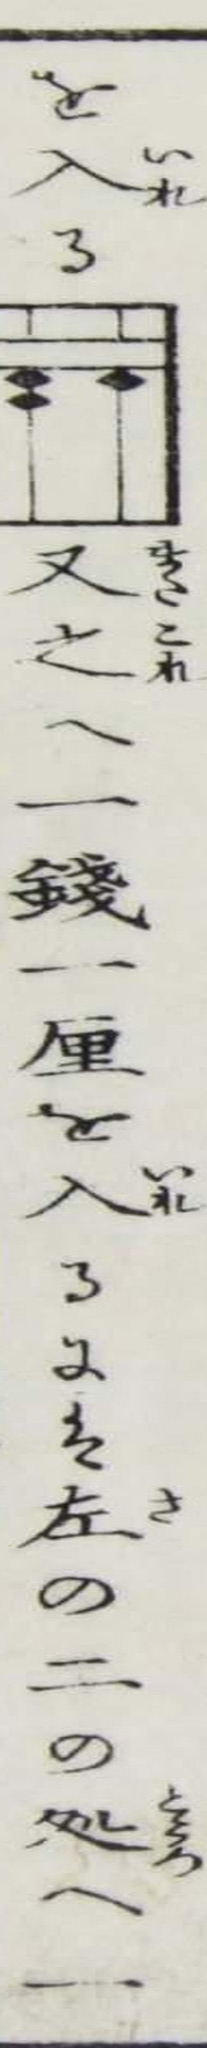を入る又之へ一銭一厘を入るには左の二の処へ一
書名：明治小學塵劫記 卷1
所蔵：東京学芸大学教育コンテンツアーカイブ
